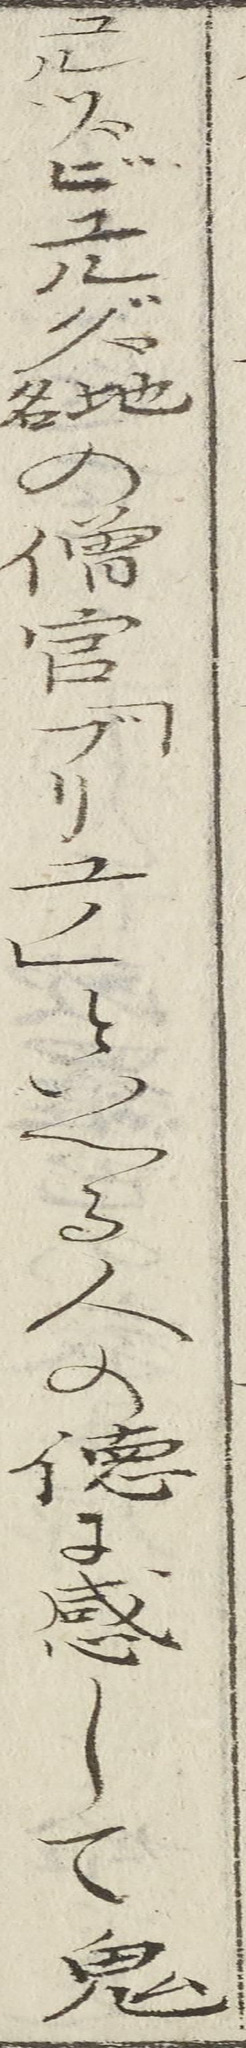ュルッ〃ビュルグ」地名の僧官「ブリユノ」といへる人の徳に感して鬼
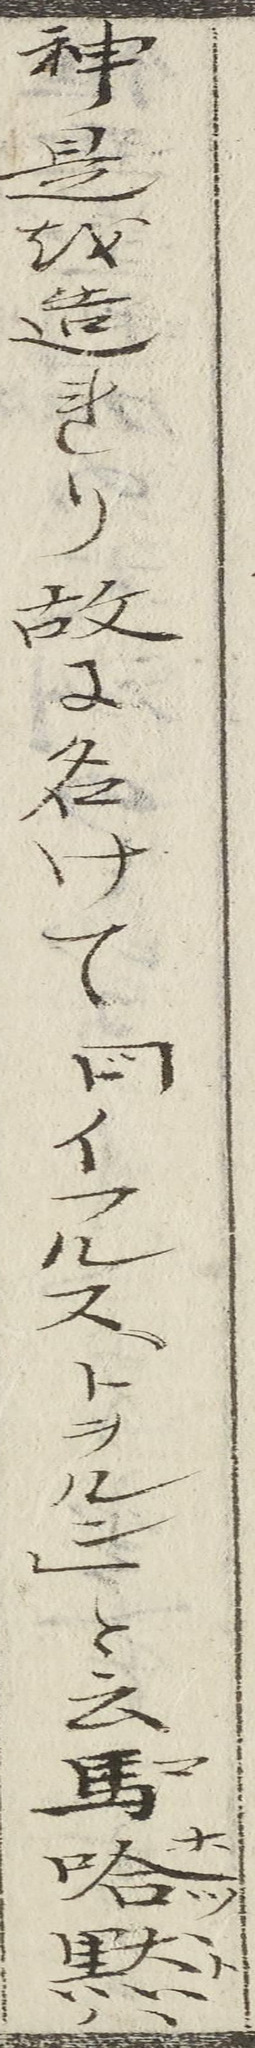神是を造れり故に名けて「トイフルス、トヲルン」と云馬哈黙ハ
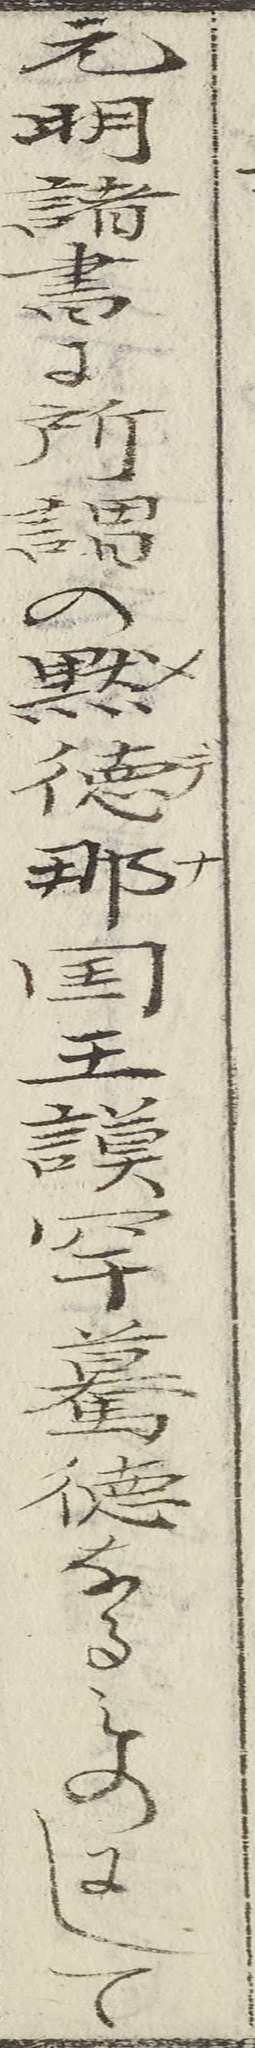元明諸書に所謂の黙徳那国王謨罕驀徳なるものにして
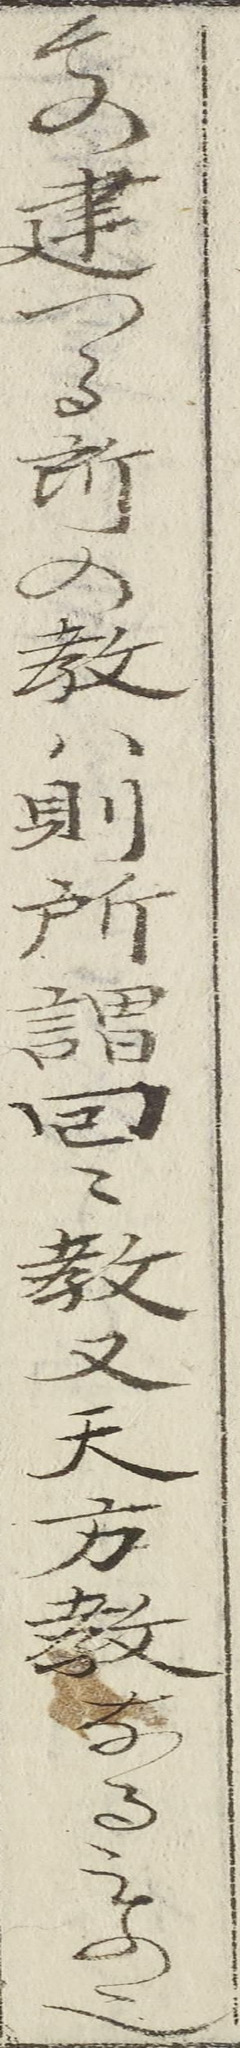その建つる所の教ハ則所謂回々教又天方教なるもの也
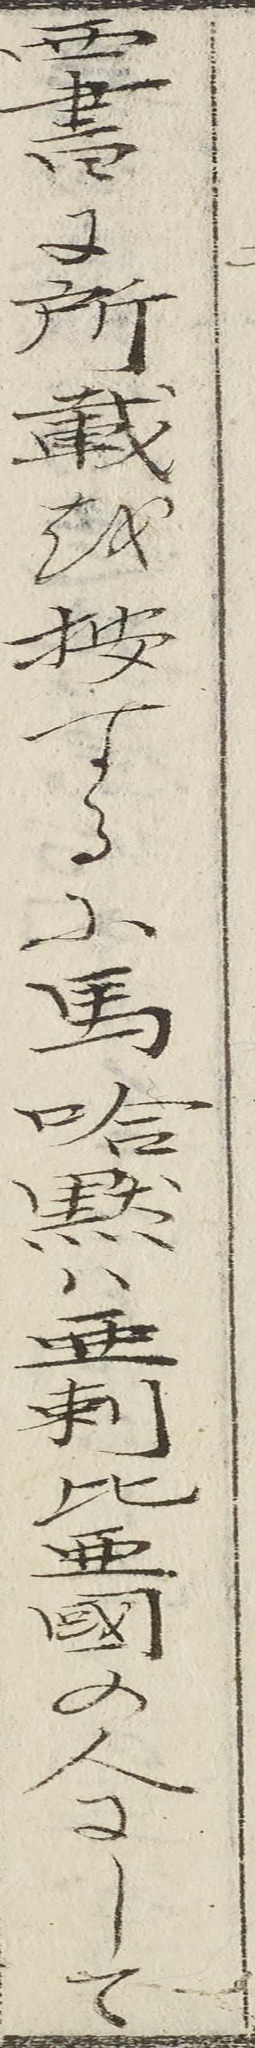西書に所載を按するに馬哈黙ハ亜刺比亜国の人にして
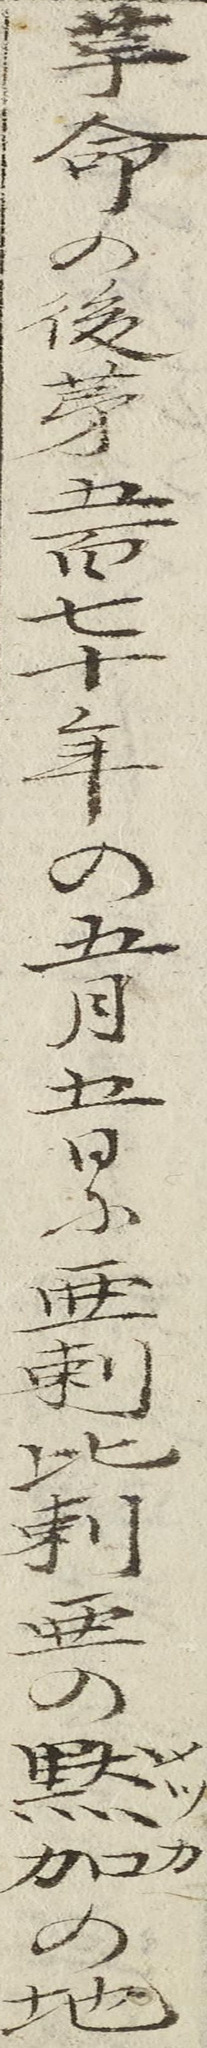革命の後第五百七十年の五月五日に亜刺比利亜の黙加の地
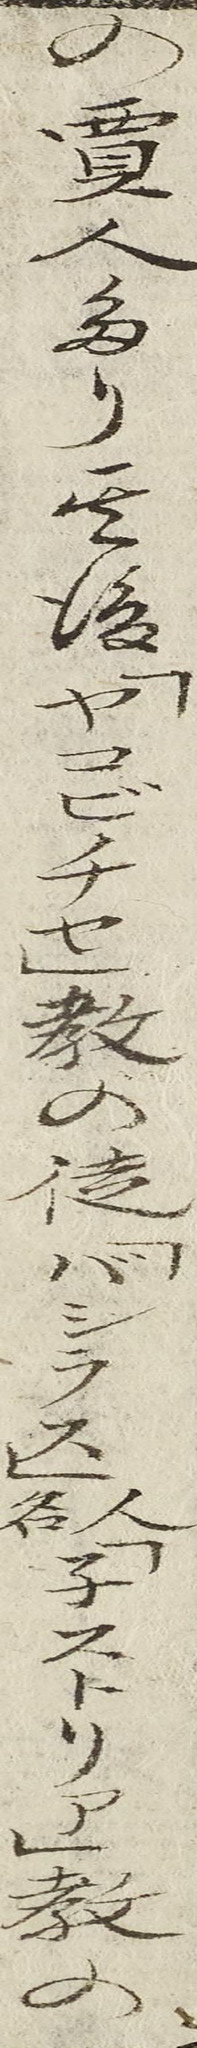の買人たり其後「ヤコビチセ」教の徒「バシラス」人名「子ストリア」教の
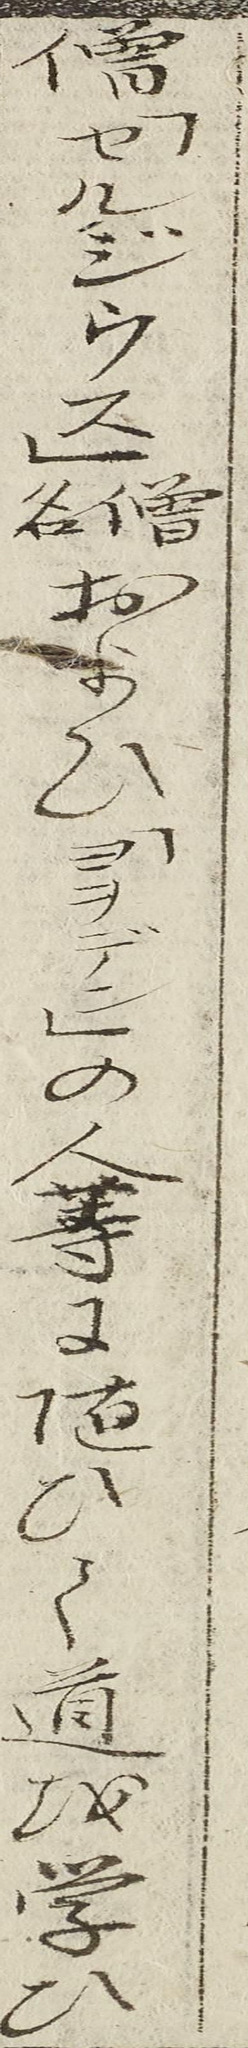僧「セルジウス」僧名およひ「ヨヲデン」の人等に随ひて道を学ひ
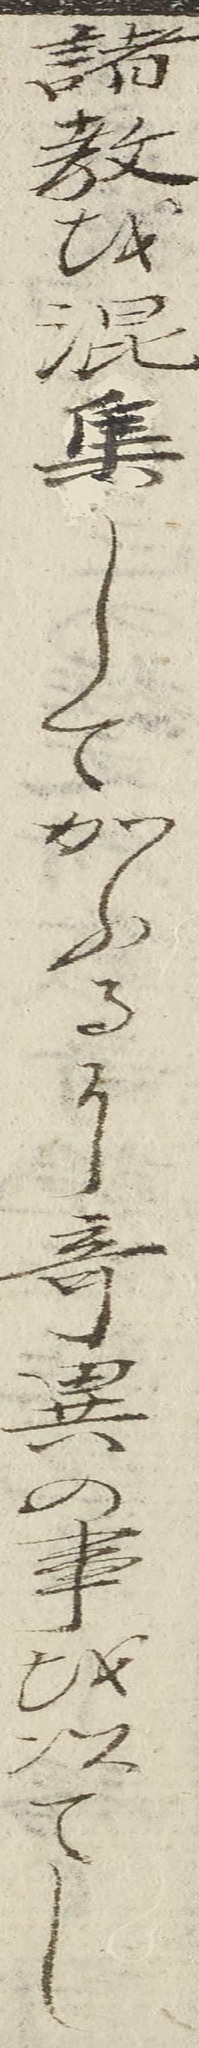諸教を混集して加ふるに奇異の事を以てし
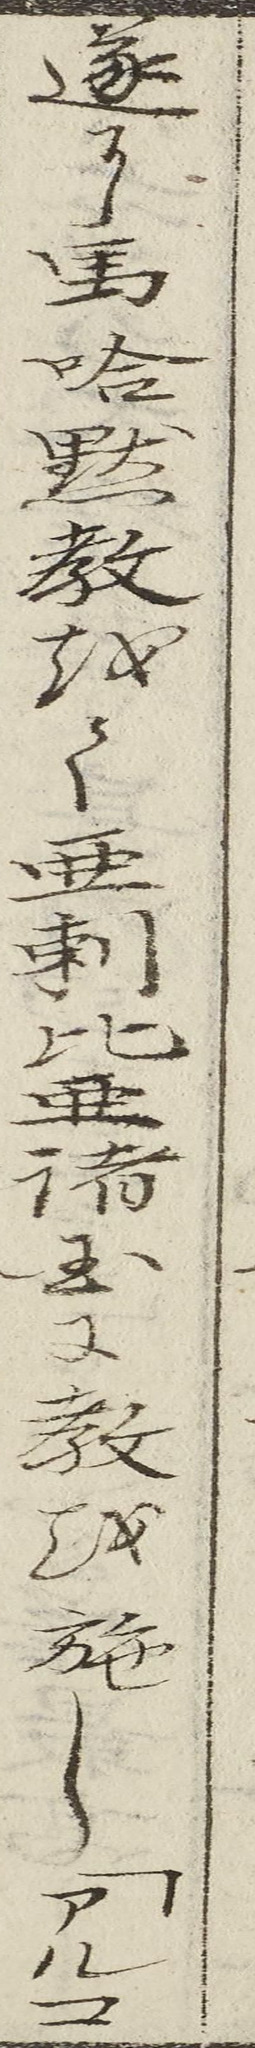遂に馬哈黙教をて亜差比亜諸国に教を施し「アルコ
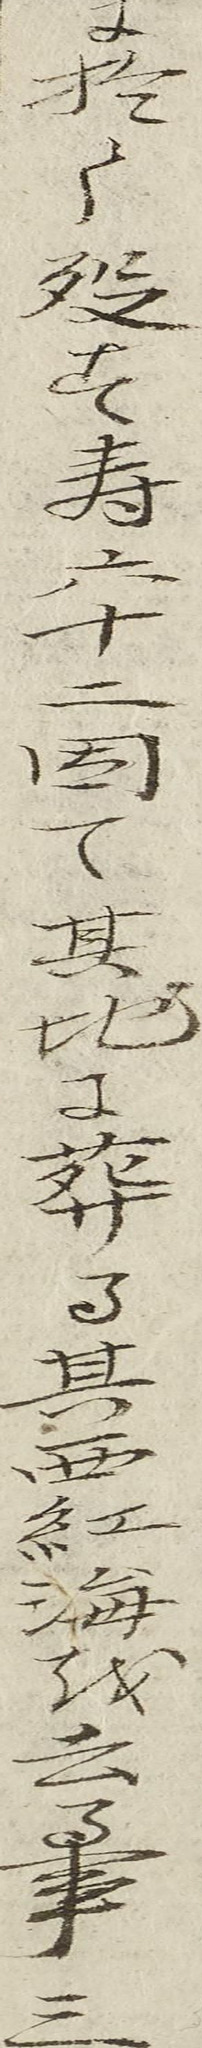に於て没す寿六十二因て其地に葬る其西紅海を去る事三
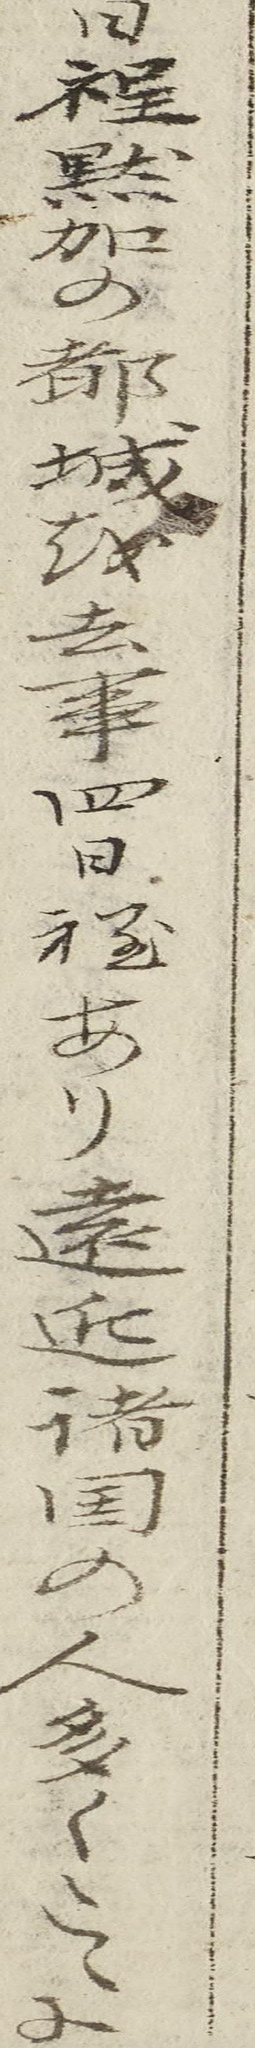日程黙加の都城を去事四日程あり遠近諸国の人多くこゝに

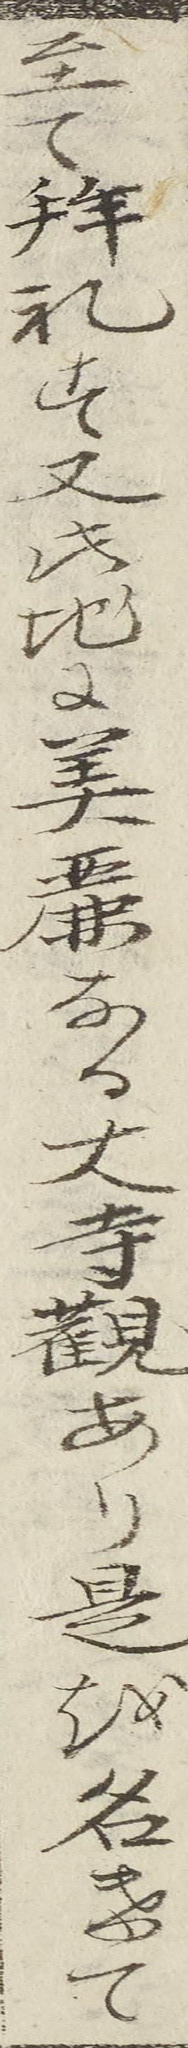至て拝礼す又此地に美麗なる大寺観あり是を名けて
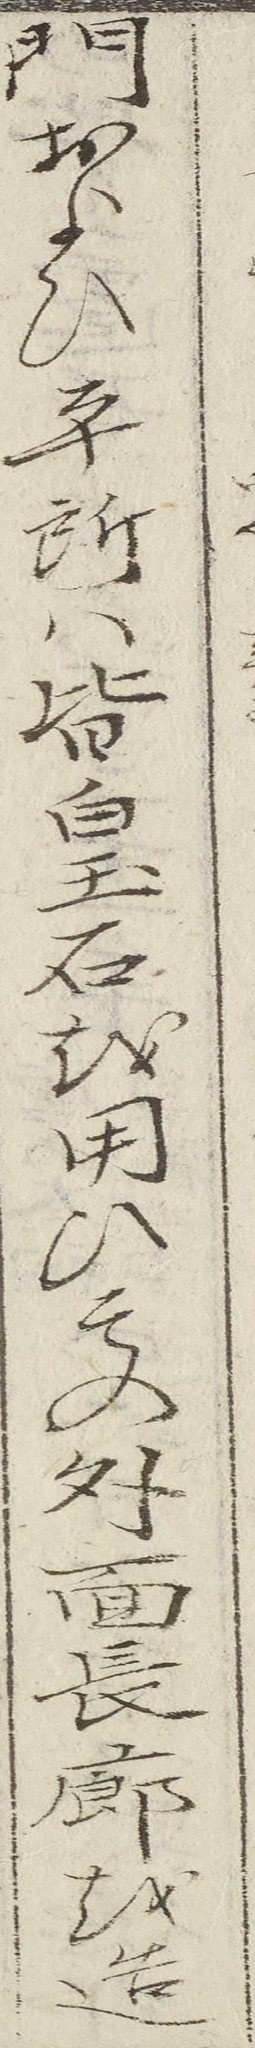門およひ平所ハ皆白土を用ひその外面長廊を造
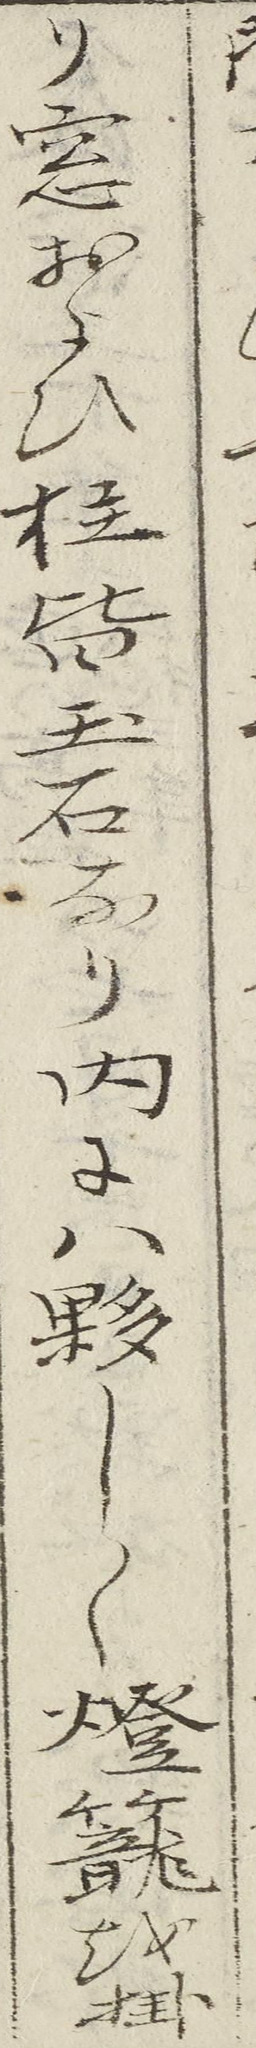り窓およひ柱皆玉石なり内にハ夥しく燈籠を掛
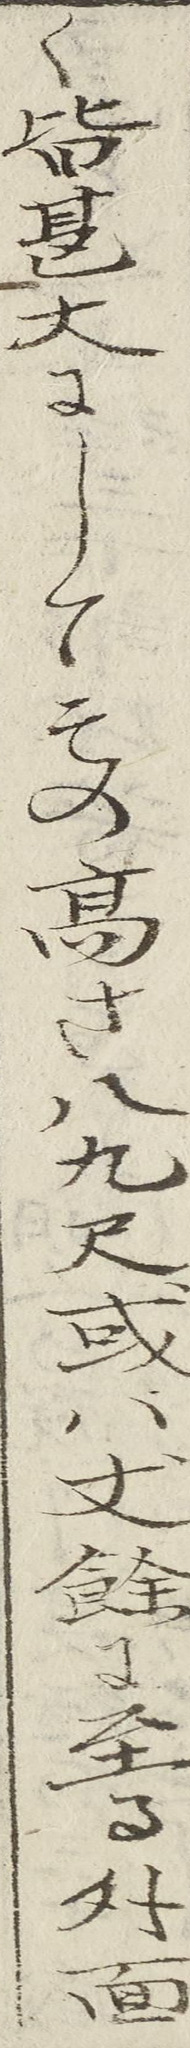く皆甚大にしてその高さ八九尺或ハ丈余に至る外面
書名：西洋雜記　坤
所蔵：東京大学地震研究所図書室 Earthquake Research Institute Library, The University of Tokyo, JAPAN
